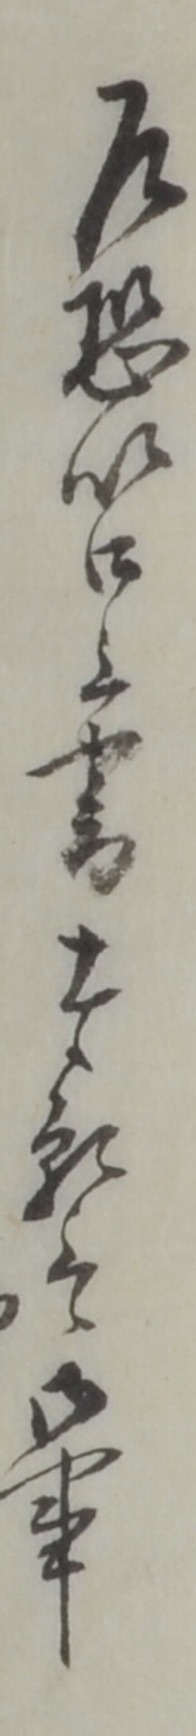乍恐以口上書奉願上候御事
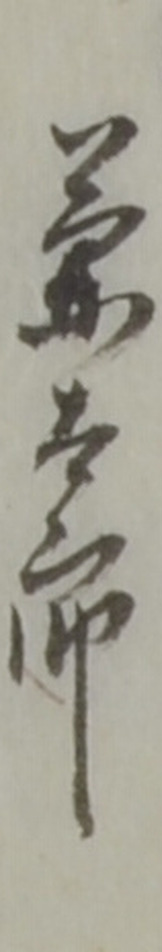兼太郎
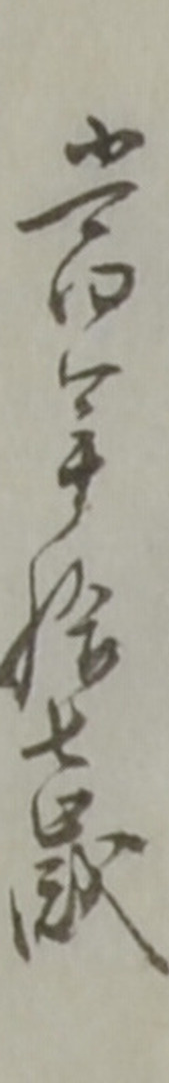当年拾七歳
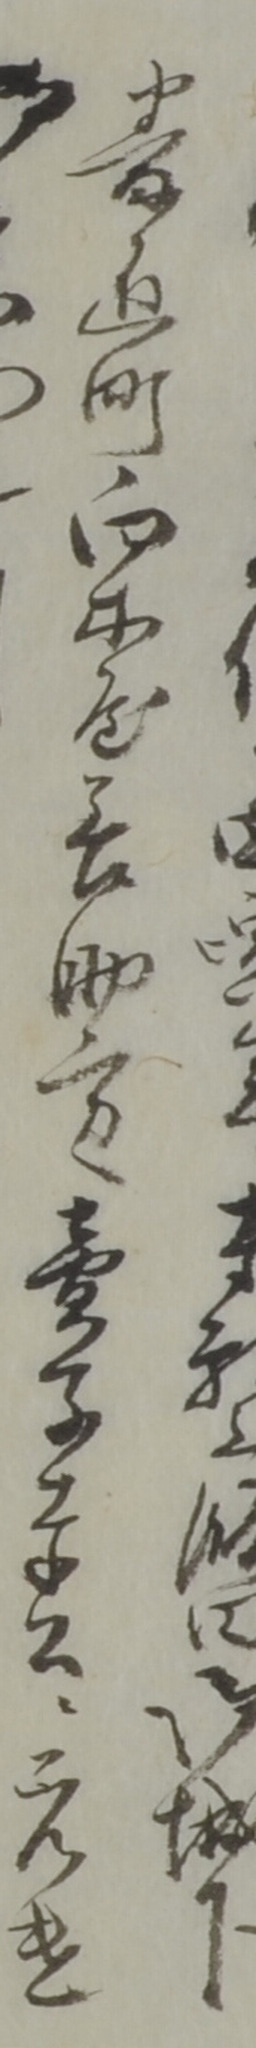番匠町白木屋善助方へ売子奉公ニ差遣
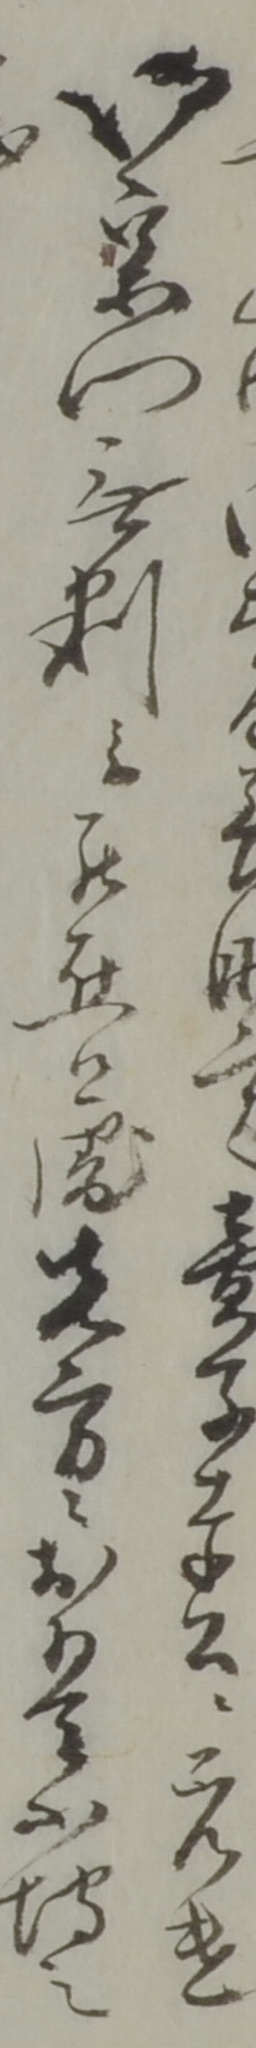御宗門無判ニ而罷在候處先方ニおゐて不埒之
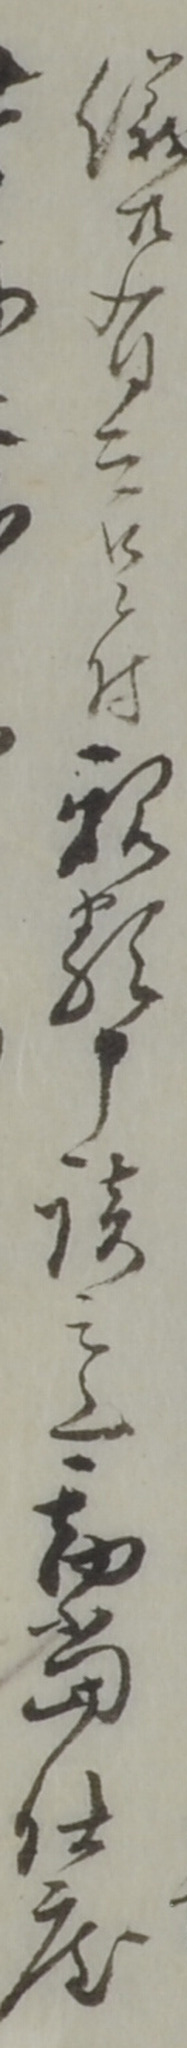儀共有之候ニ付親類申談之上勘当仕度
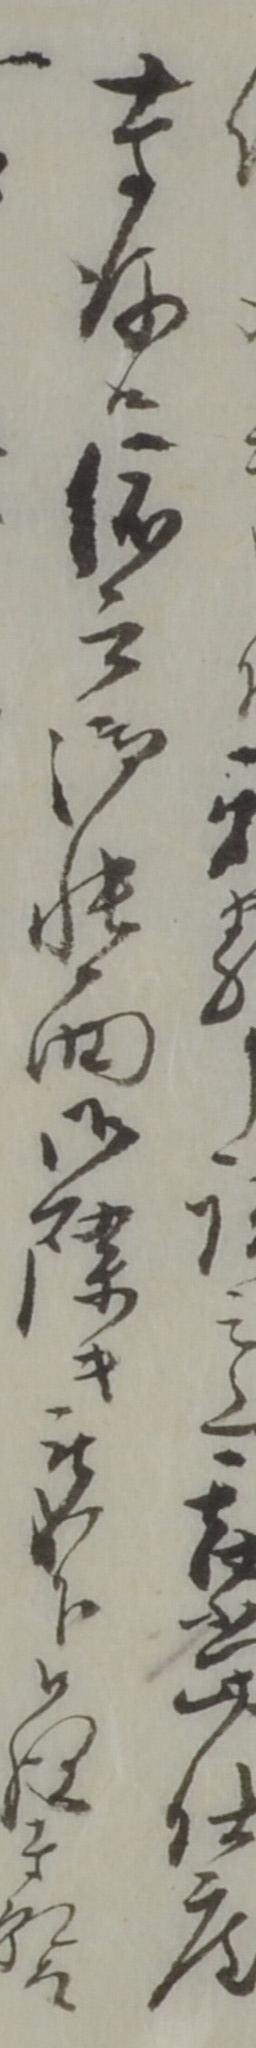奉存候依之御帳面御除キ被成下候様奉願候
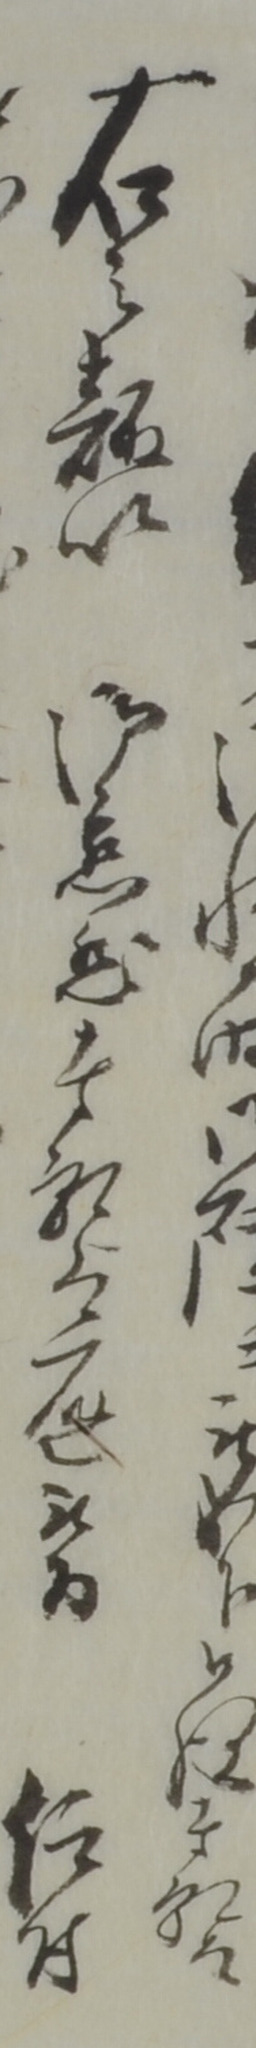右之趣以御慈悲奉願上候通被為仰付
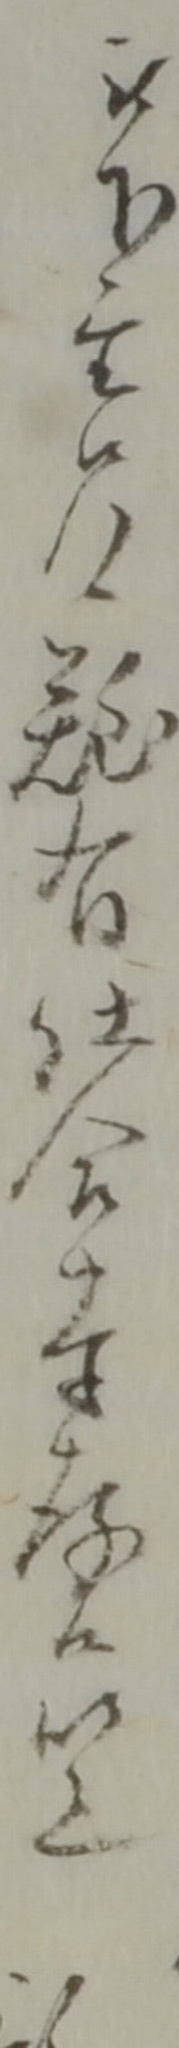被下置候ハヽ難有仕合奉存候以上
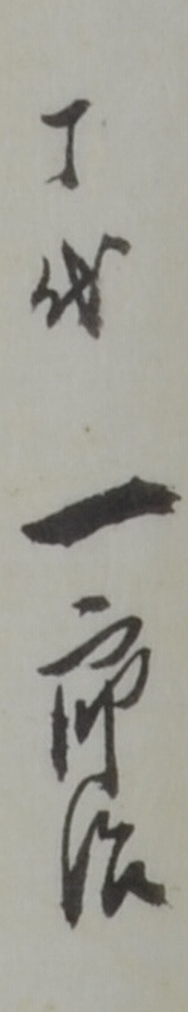丁代一郎治
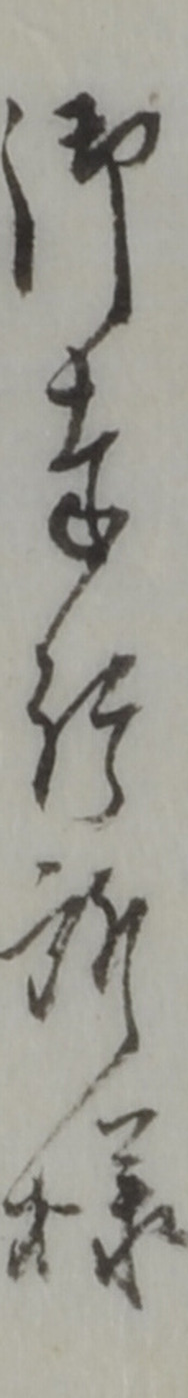御奉行所様
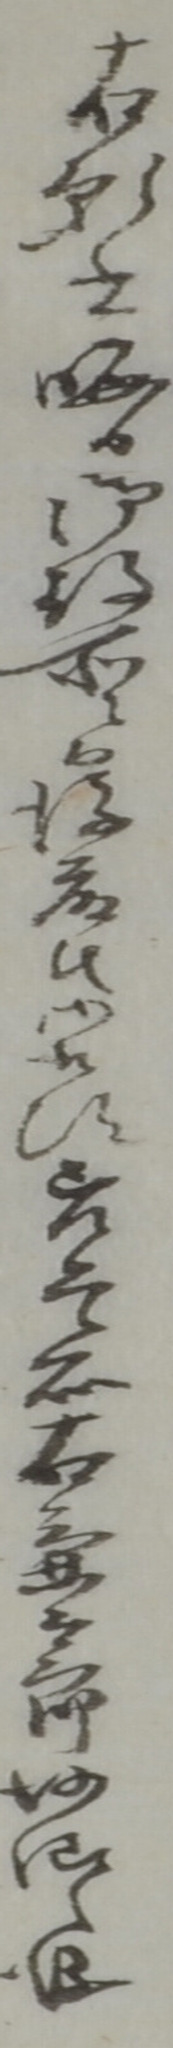右願書晦日御役所ニ而後藤氏御取次差上候所右兼太郎何様之儀
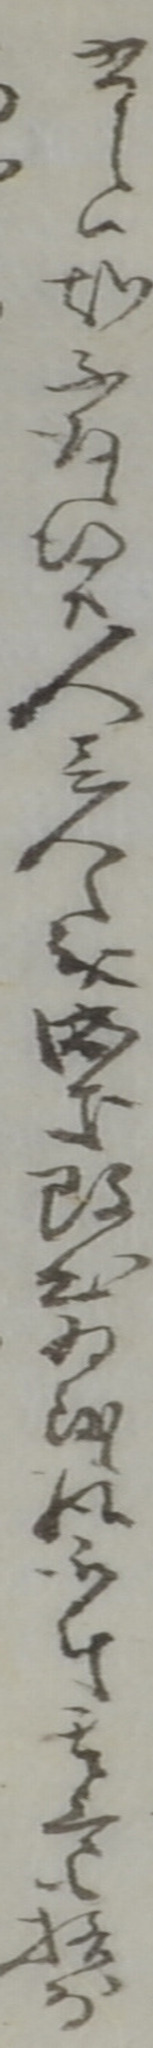有之候哉不存候得共人壱人候之義成丈改心為致候様取計其上ニも格別
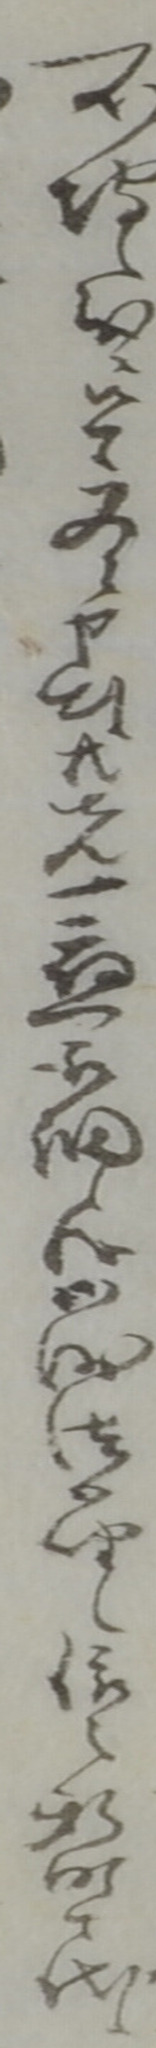不埒候義ニ候者又々申出候共先一応取調候様御沙汰御座候依之新町丁代へ
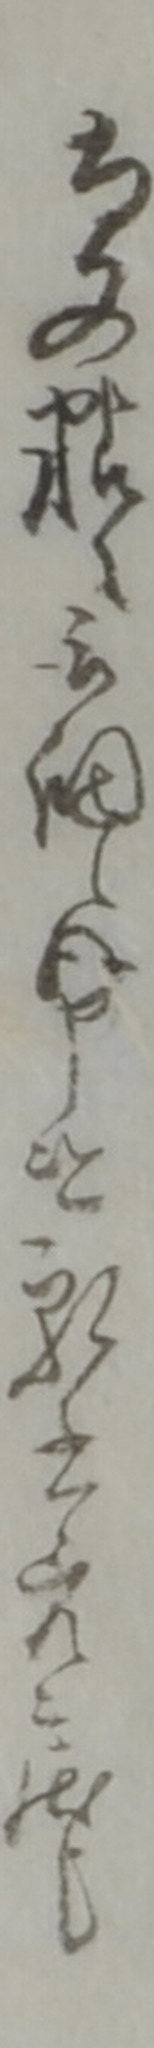尚又精々取調候様申遣願書差上戻申候
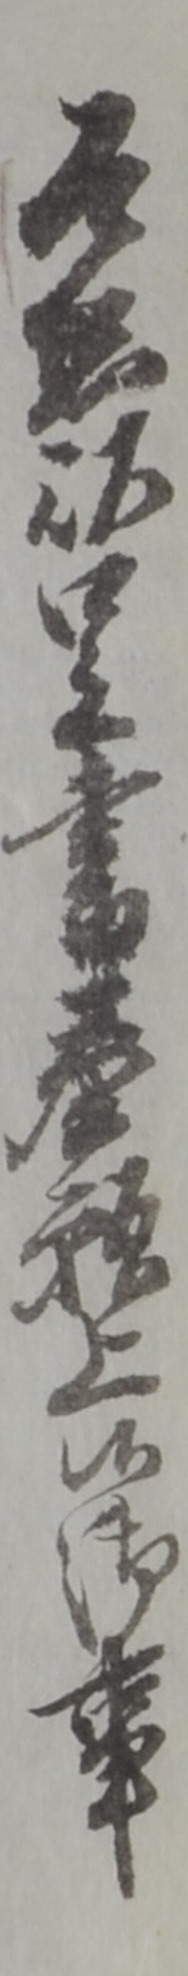乍恐以口上書奉願上候御事
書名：諸願書控簿
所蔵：伊那市立高遠町図書館・合同会社AMANE
